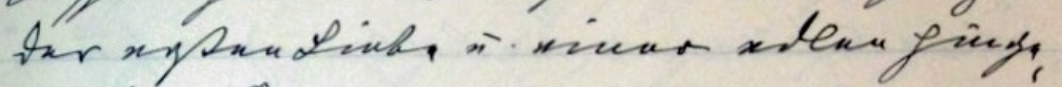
der ersten Liebe u. einer edlen hinge
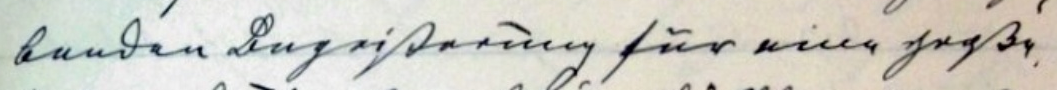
benden Begeisterung für eine große
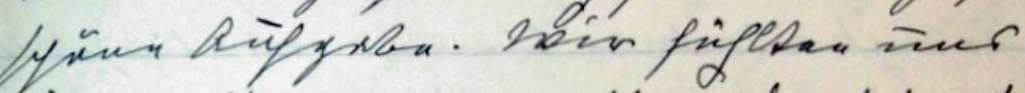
schöne Aufgabe. Wir fühlten uns
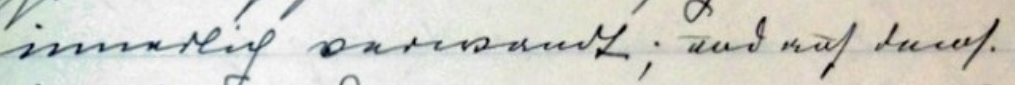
uns innerlich verwandt; und auf dems.
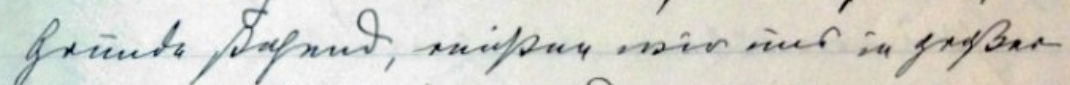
Grunde stehend, reichten wir uns in großer
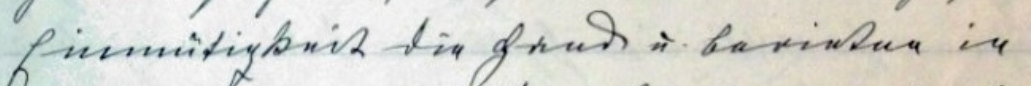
Einmütigkeit die Hand u. berieten in
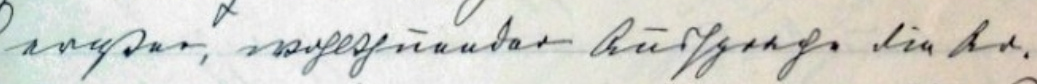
erster wohlthender Aussprache die Ar
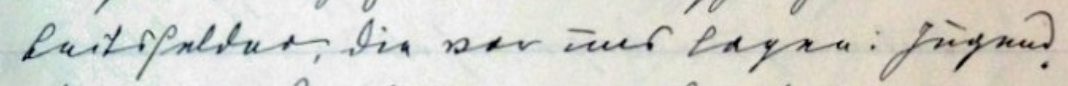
beitsfelder, die vor uns lagen: Jugend
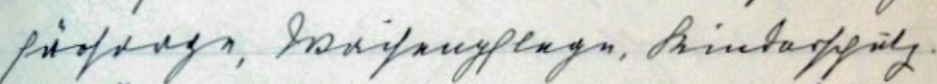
fürsorge, Waisenpflege, Kinderschutz.
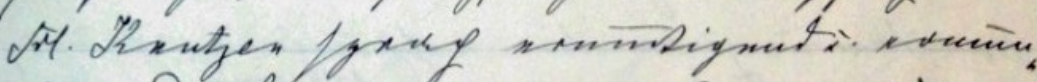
Frl. Knutzen sprach ermutigend u. ermun
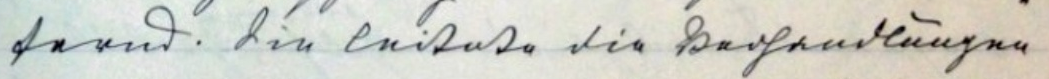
ternd. Sie leitete die Verhandlungen
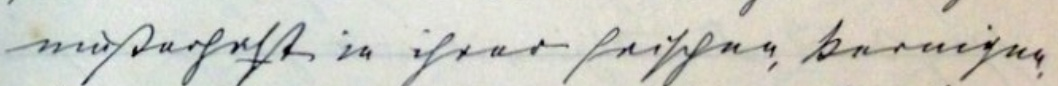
meisterhaft in ihrer frischen kernigen
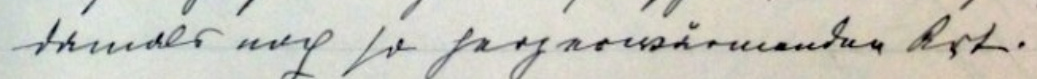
damals noch so herzerwärmenden Art.
